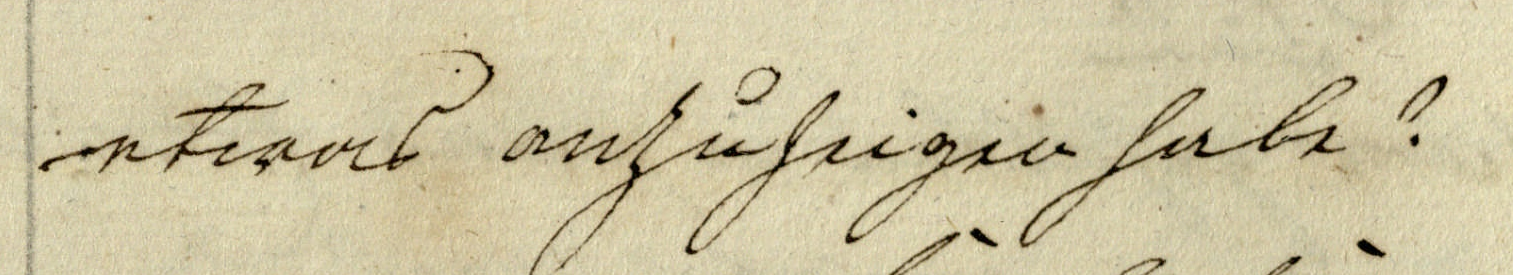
etwas anzuzeigen habe?
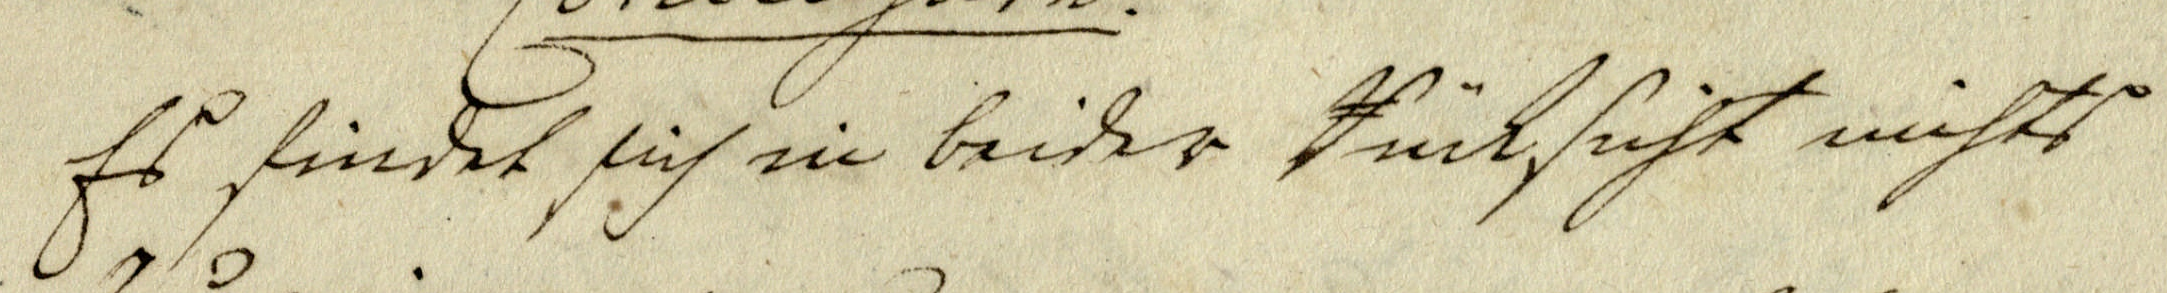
Es findet sich in beider Rücksicht nichts
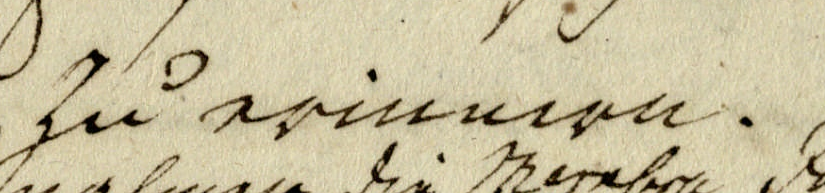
in erinnern.
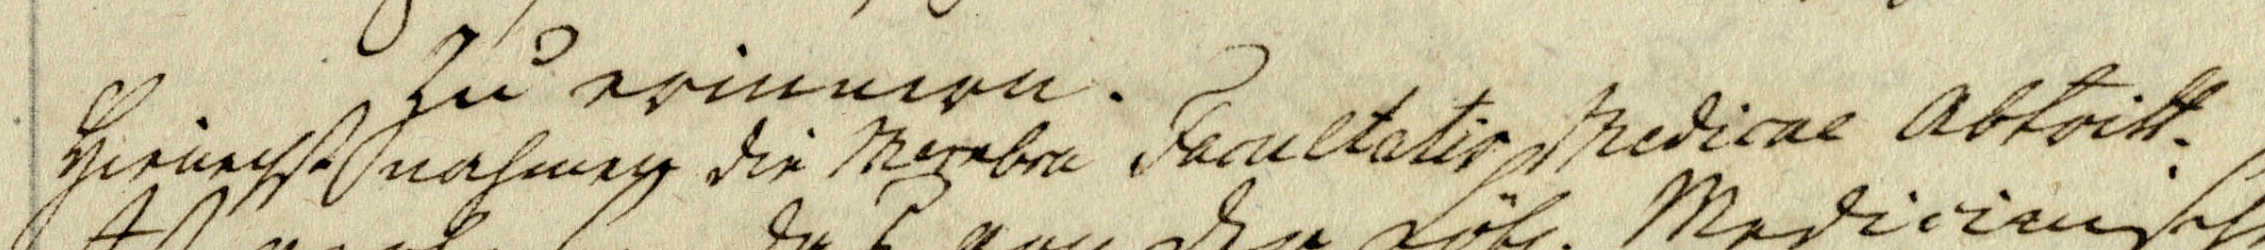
Hienechst nahmen die Membra Facultatis Medicae Abtritt.
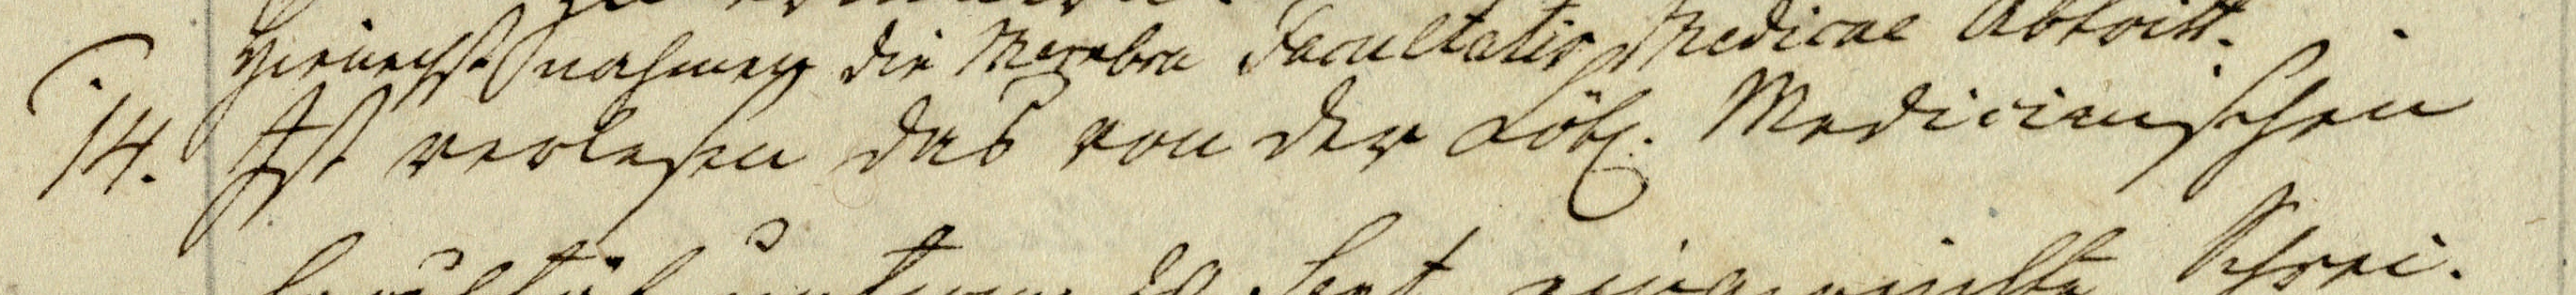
14. Ist verlesen das von der Löbl. Medicinischen
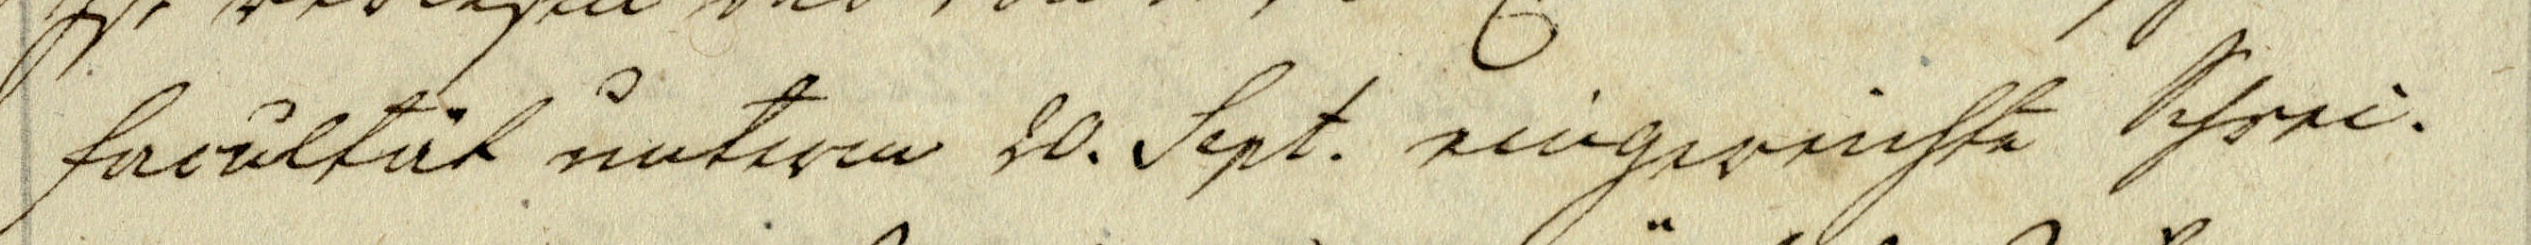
Facultät unterm 20. Sept. eingereichte Schrei¬
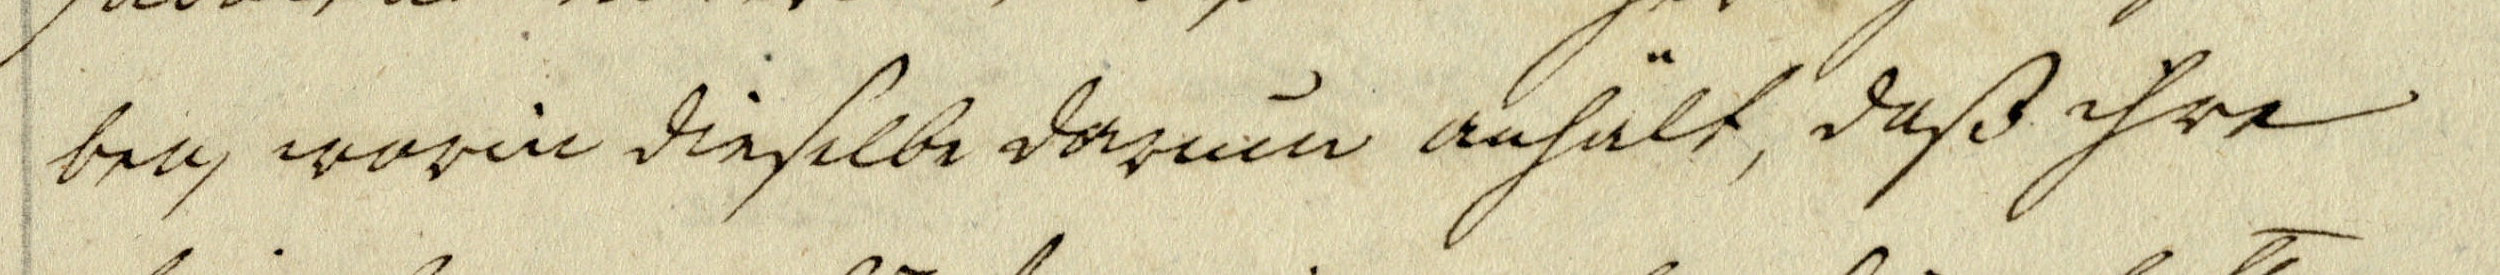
ben, worin dieselbe darum anhält, daß ihre
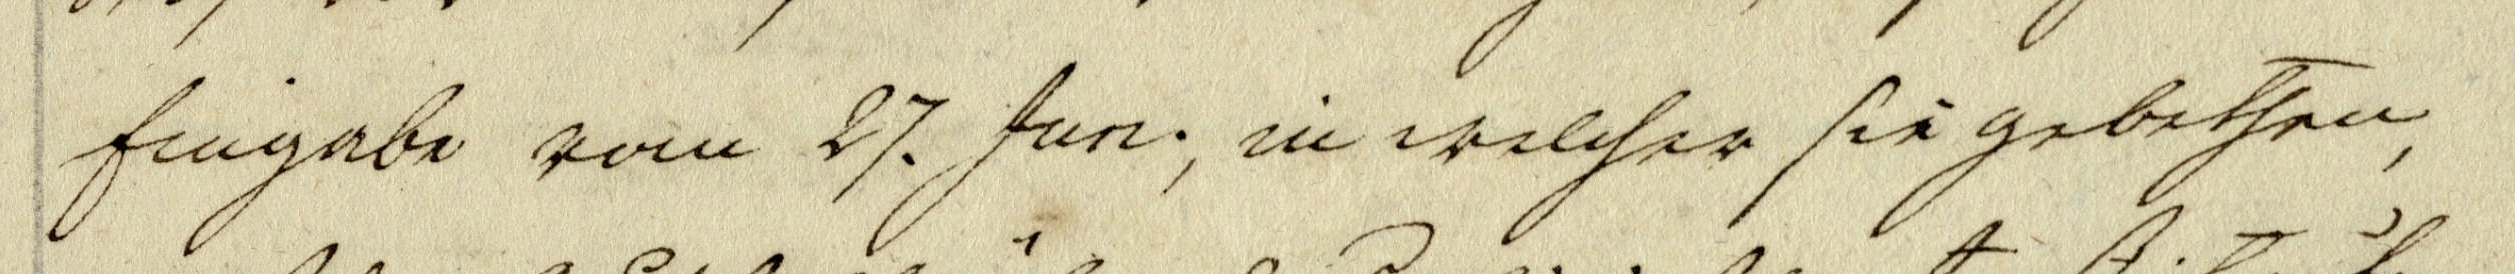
Eingabe vom 27. Jun., in welcher sie gebethen,
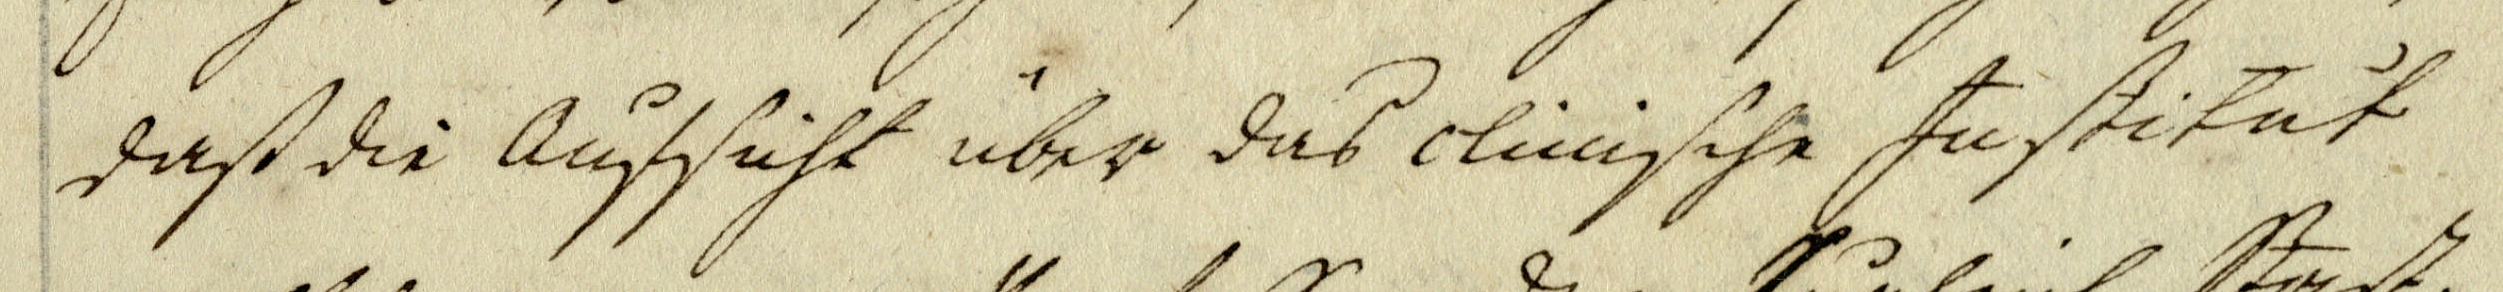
daß die Aufsicht über das clinische Institut
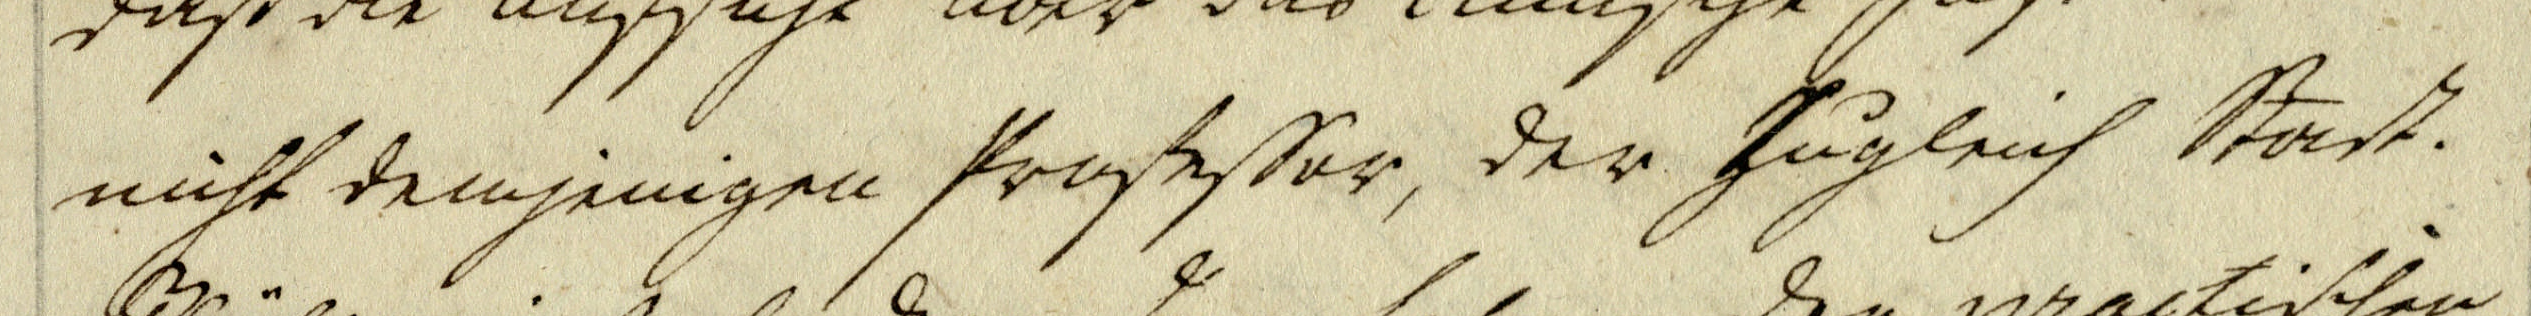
nicht demjenigen Professor, der Zugleich Stadt¬
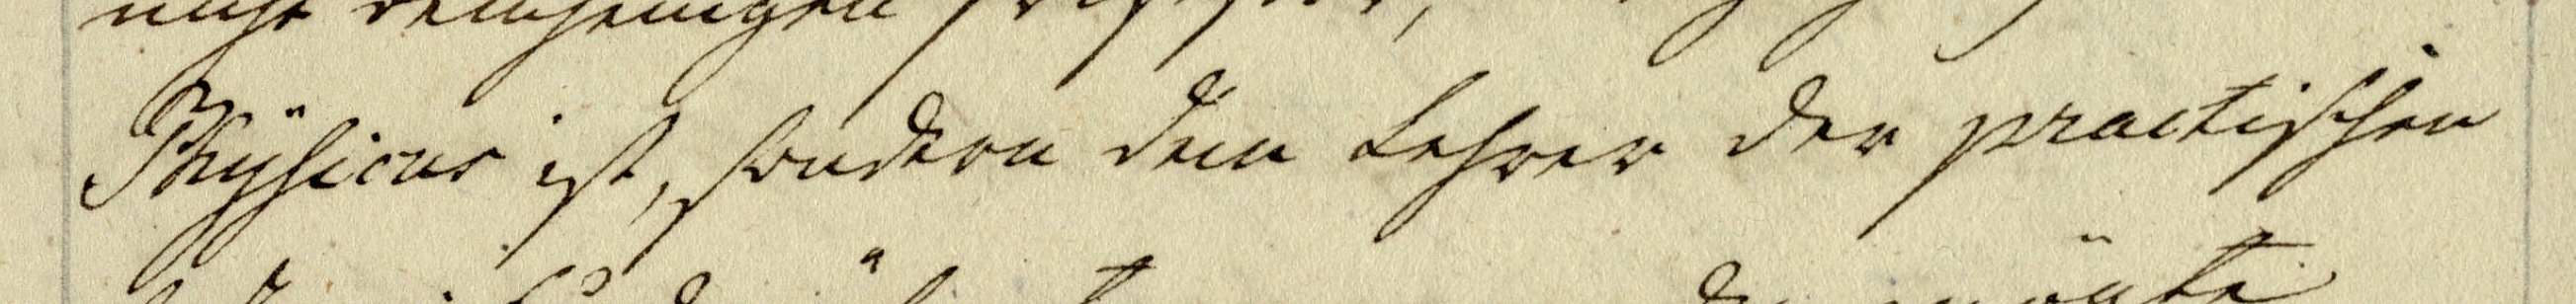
Phÿsicus ist, sondern dem Lehrer der practischen
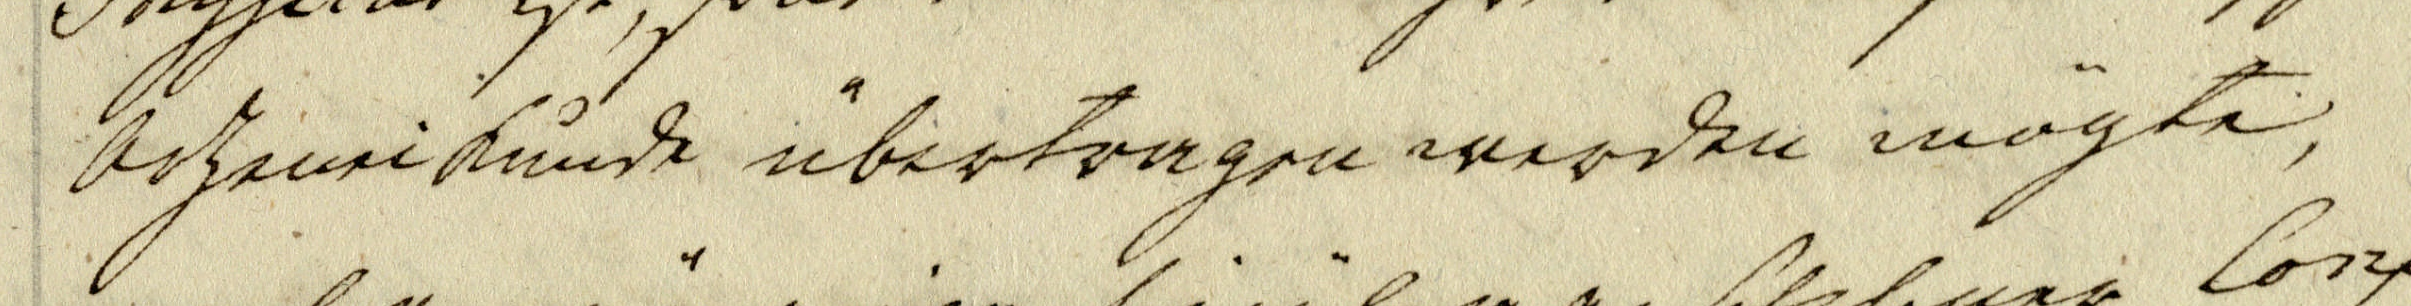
Arzeneikunde übertragen werden mögte;
